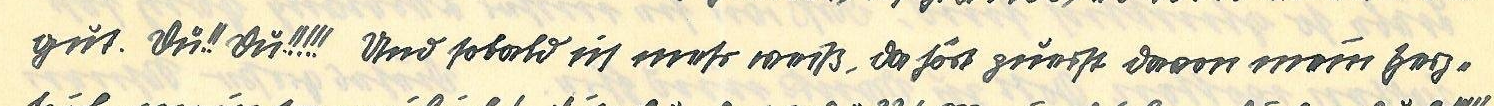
gut. Du!! Du!!!! Und sobald ich mehr weiß, da hört zuerst davon mein Herz¬
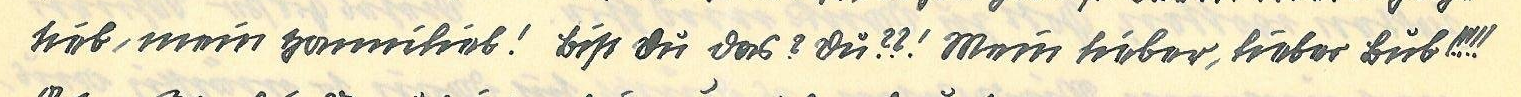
lieb, mein Herzlieb! Bist du das? Du??! Mein lieber, lieber Bub!!!!!
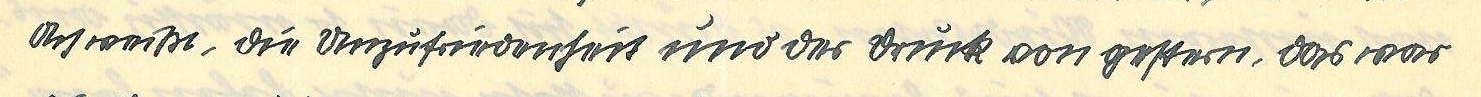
Ach weißt, die Unzufriedenheit und der Druck von gestern, das war
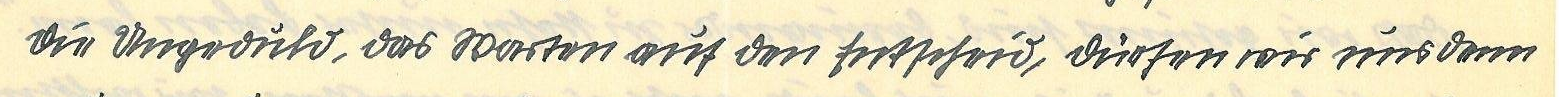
die Ungeduld, das Warten auf den Entscheid, dürfen wir uns denn
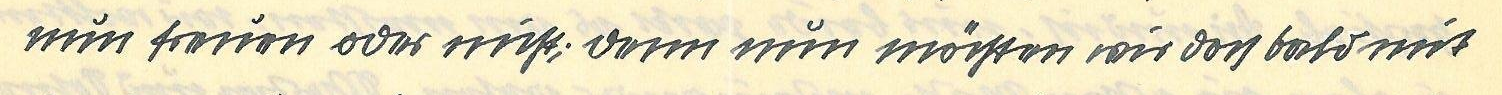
nun freuen oder nicht; denn nun möchten wir doch bald mit
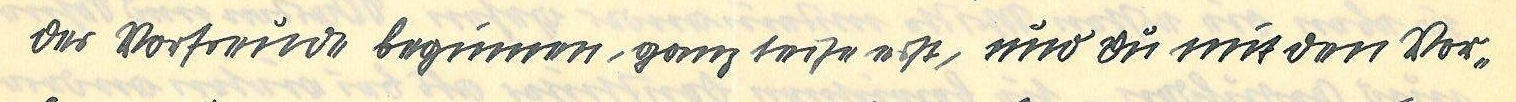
der Vorfreude beginnen, ganz leise erst, und Du mit den Vor¬
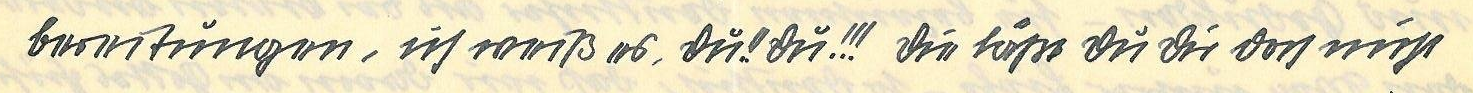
bereitungen, ich weiß es, Du!! Du!!! Die läßt Du Dir doch nicht
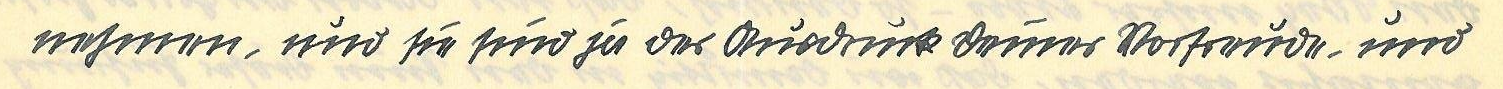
nehmen, und sie sind ja der Ausdruck Deiner Vorfreude, und
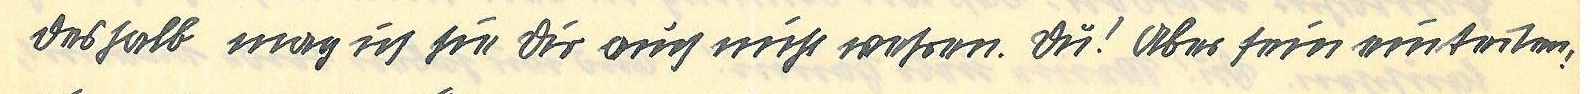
deshalb mag ich sie Dir auch nicht wehren. Du! Aber fein einteilen,
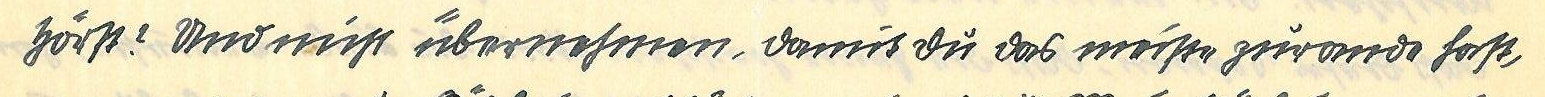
hörst? Und nicht übernehmen, damit Du das meiste zurande hast,
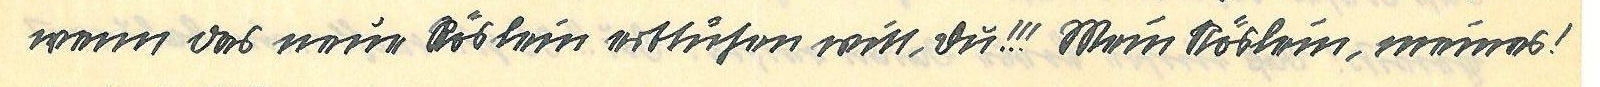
wenn das neue Röslein erblühen will, Du!!! Mein Röslein, meines!
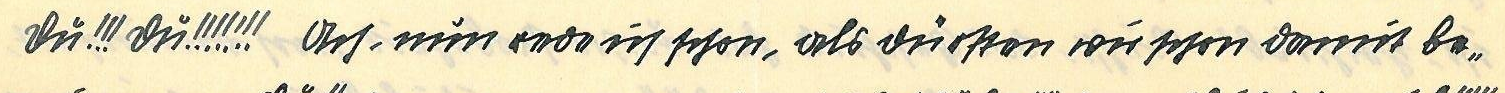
Du!!! Du!!!!!!! Ach, nun rede ich schon, als dürften wir schon damit be¬
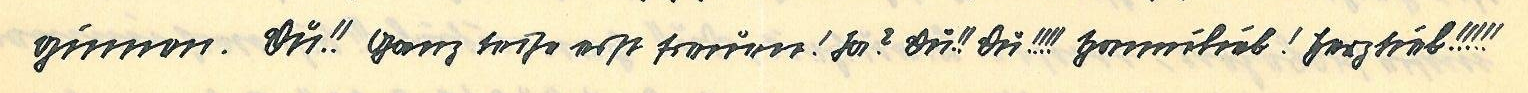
ginnen. Du!! Ganz leise erst freuen! Ja? Du!! Du!!!! lieb! Herzlieb!!!!!
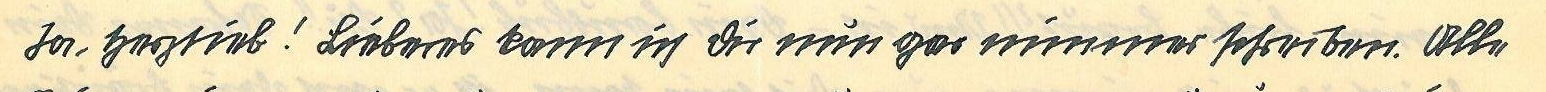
Ja, Herzlieb! Lieberes kann ich Dir nun gar nimmer schreiben. Alle
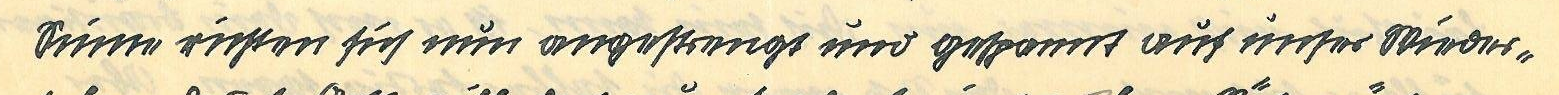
Sinne richten sich nun angestrengt und gespannt auf unser Wieder¬
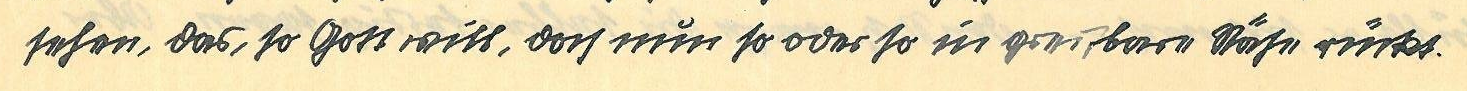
sehen, das, so Gott will, doch nun so oder so in greifbare Nähe rückt.
